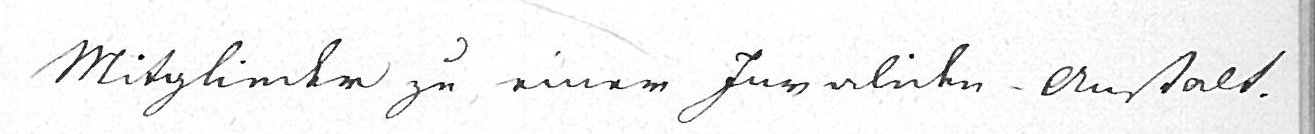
Mitglieder zu einer Invaliden-Anstalt.
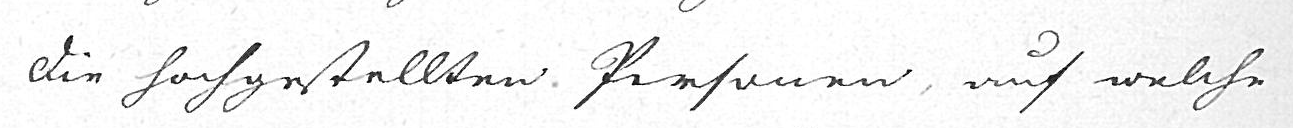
Die hochgestellten Personen, auf welche
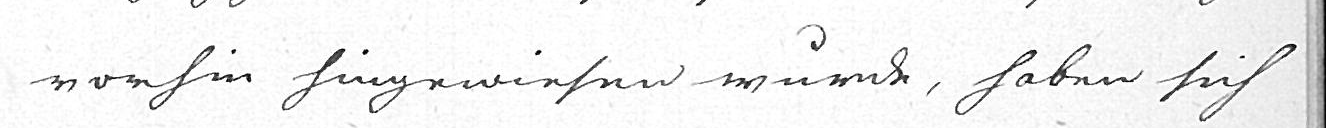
vorhin hingewiesen wurde, haben sich
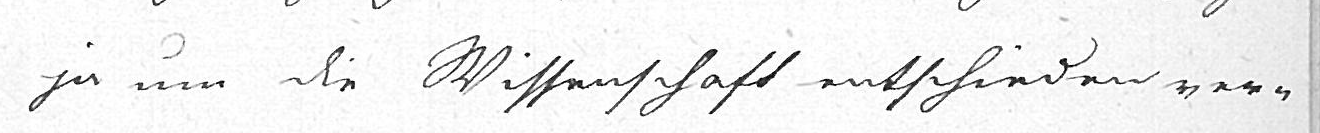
ja um die Wissenschaft entschieden ver-
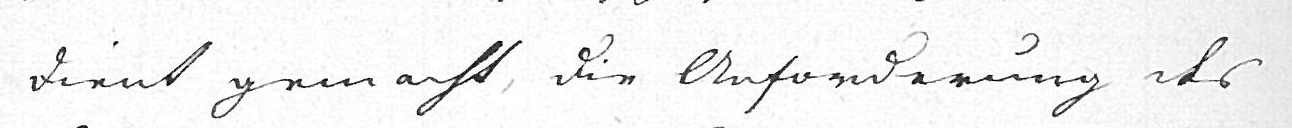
dient gemacht. Die Anforderung des
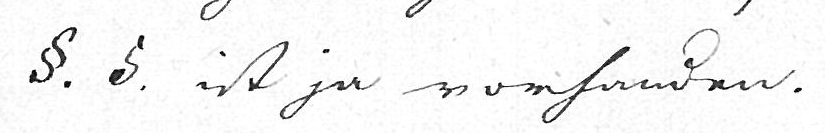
§. 5. ist ja vorhanden.
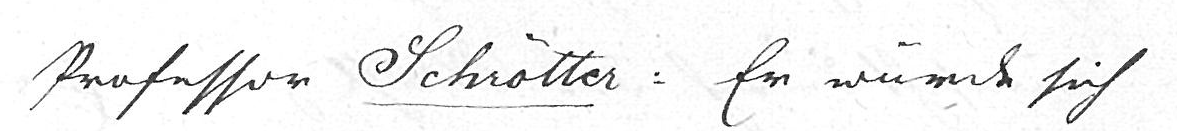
Professor Schrötter: Er würde sich
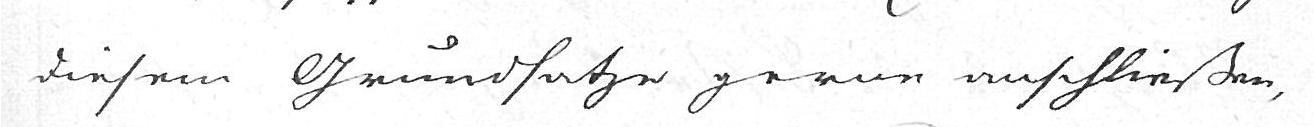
diesem Grundsatze gerne anschließen,
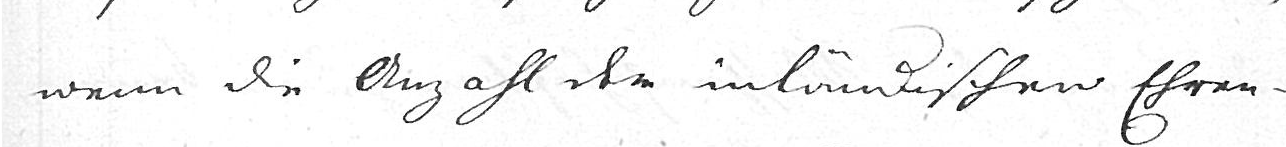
wenn die Anzahl der inländischen Ehren-
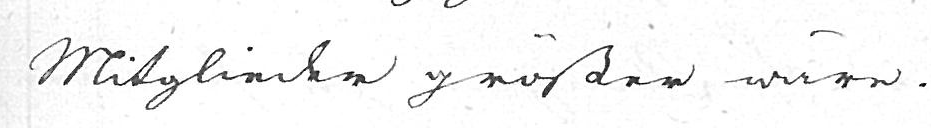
Mitglieder größer wäre.
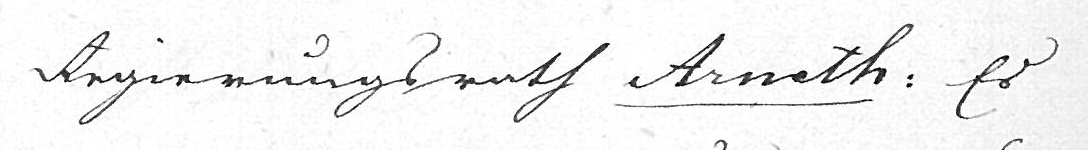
Regierungsrath Arneth: Es
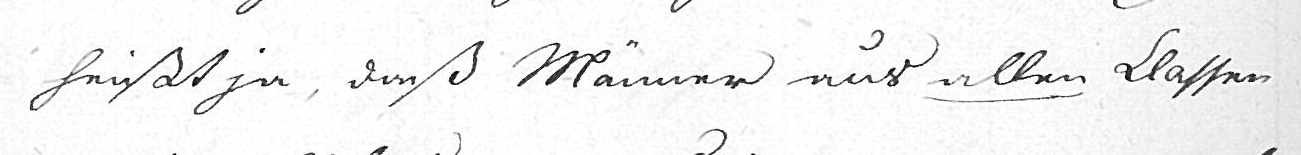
heißt ja, daß Männer aus allen Classen
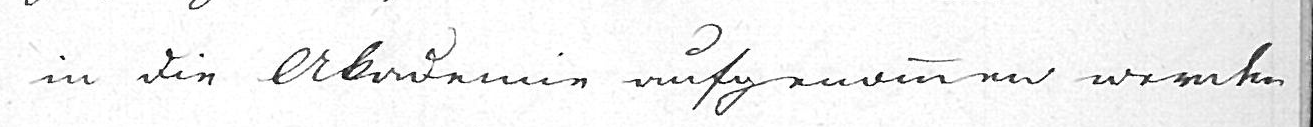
in die Akademie angenommen werden
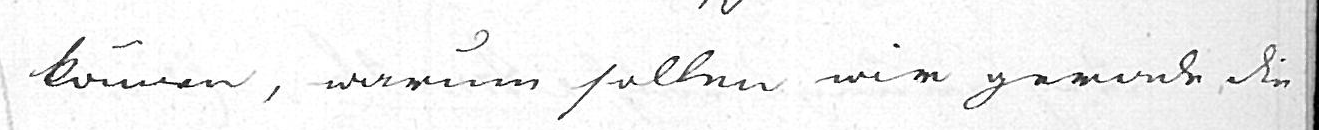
können, warum sollen wir gerade die
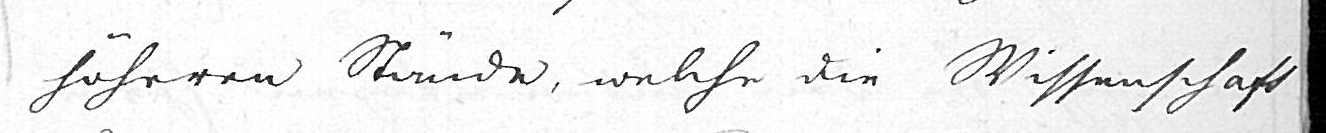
höheren Stände, welche die Wissenschaft
